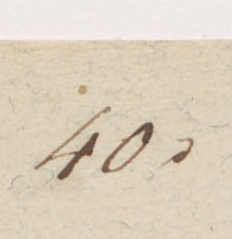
40.
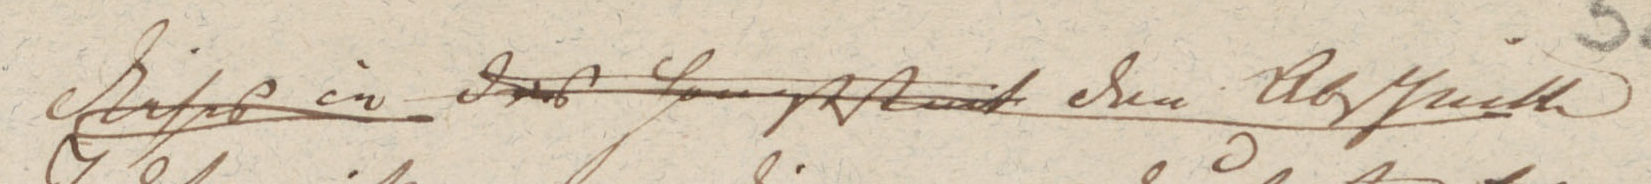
Dieses in Das Hauptstück den Abschnitt
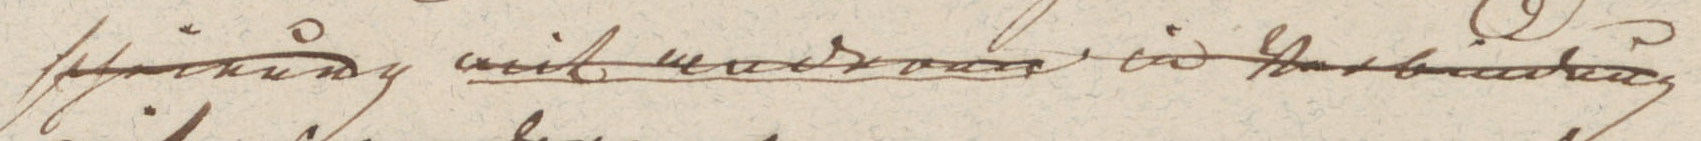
scheinung mit modernen in Verbindung
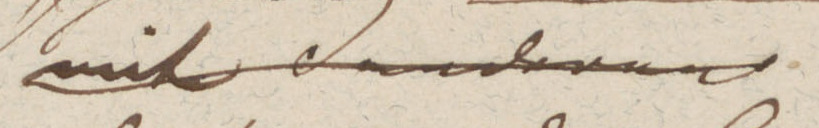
mit moderne
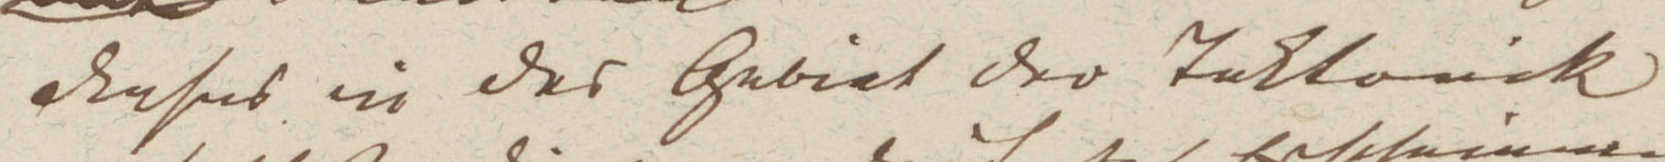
dieses in das Gebiet der Tektonik
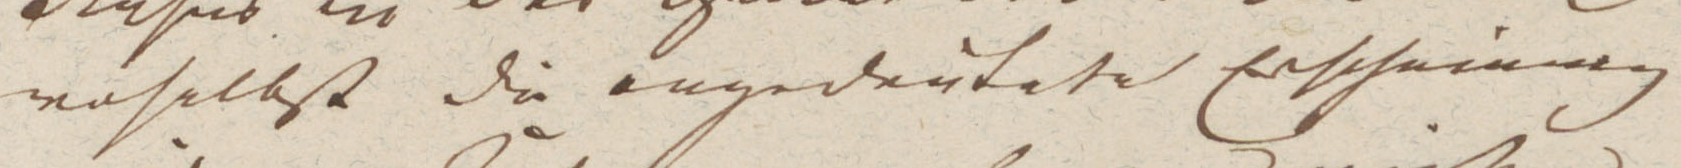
woselbst die angedeutete Erscheinung
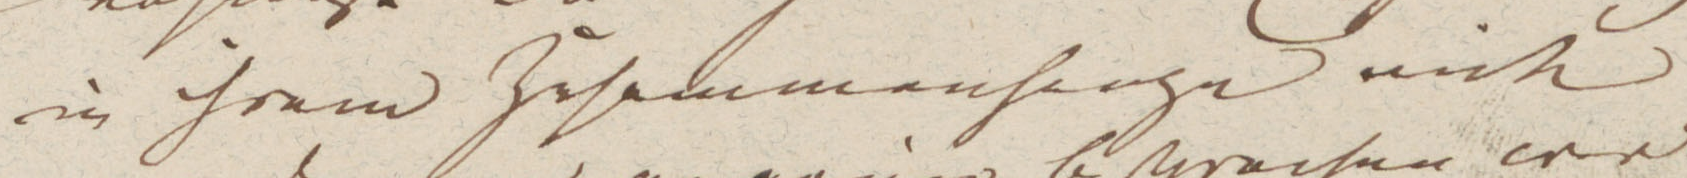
in ihrem Zusammenhange mit
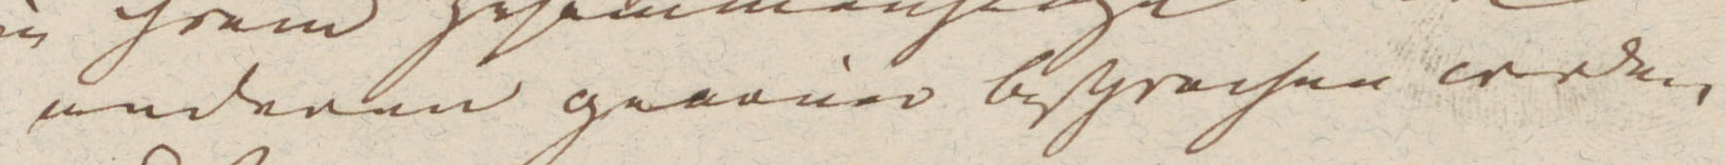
andernen genauer besprochen werden
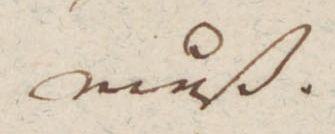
muss.
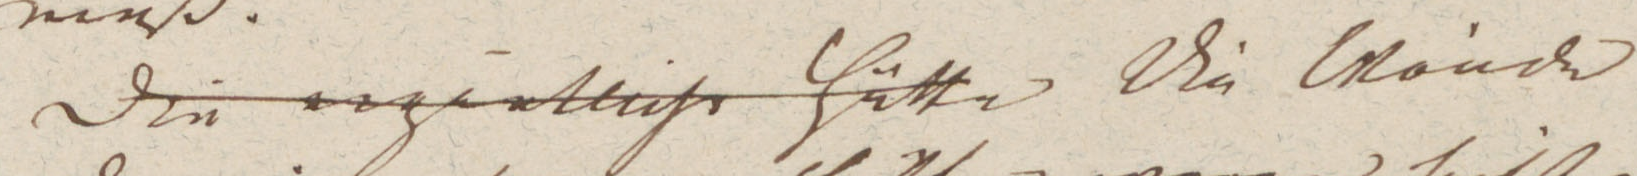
Die eigentliche Hütte Die Wände
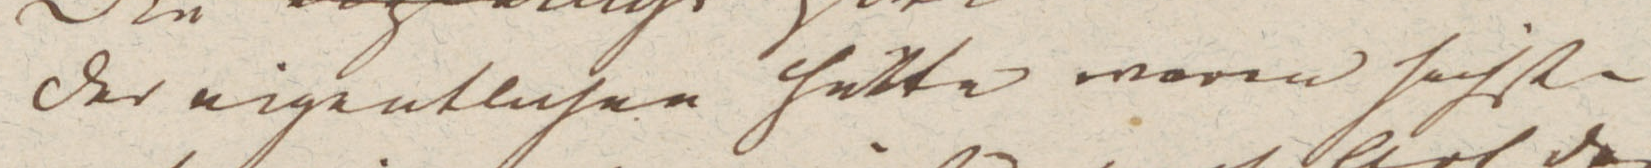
der eigentlichen Hütte waren höchst
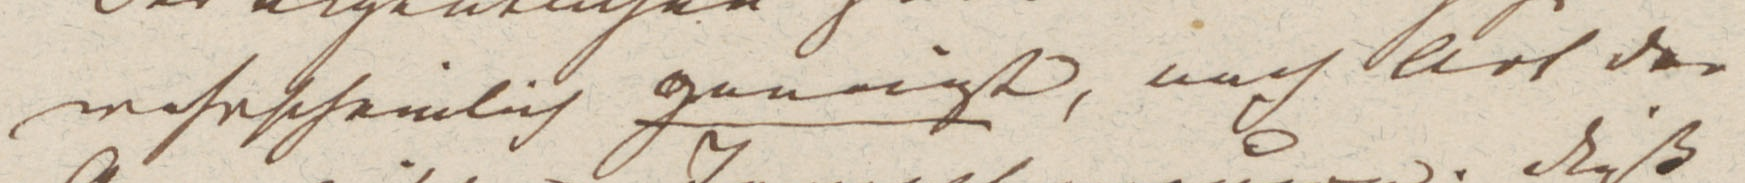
wahrscheinlich geneigt, nach Art der
